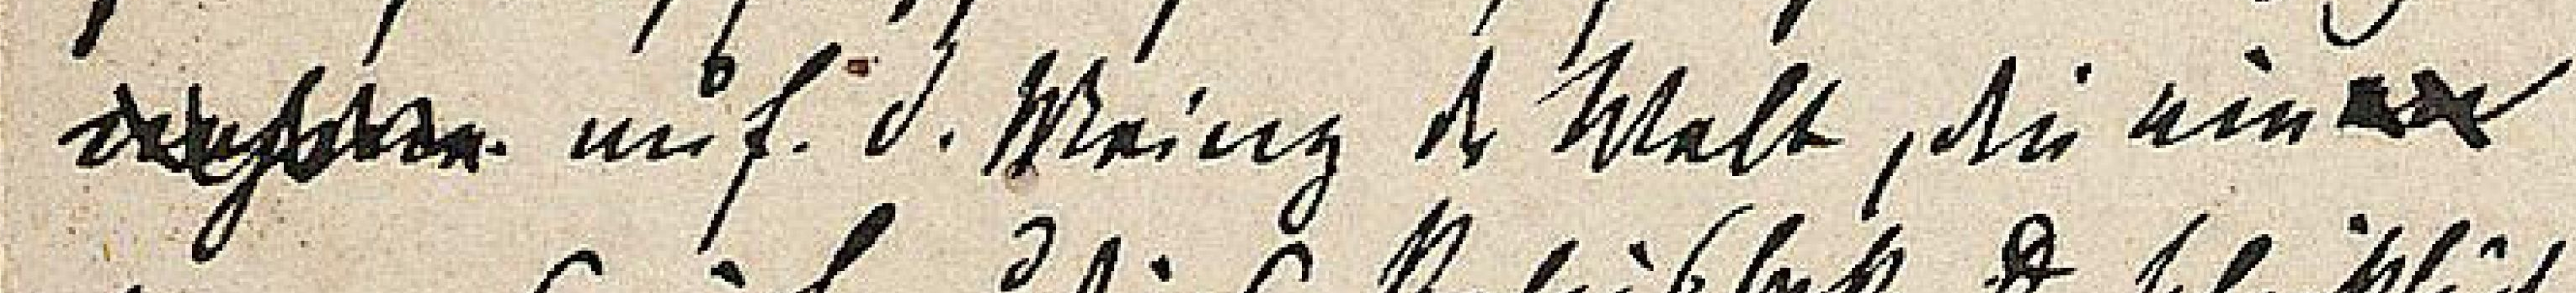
nahme auf. d. Meing. der Welt, die einen
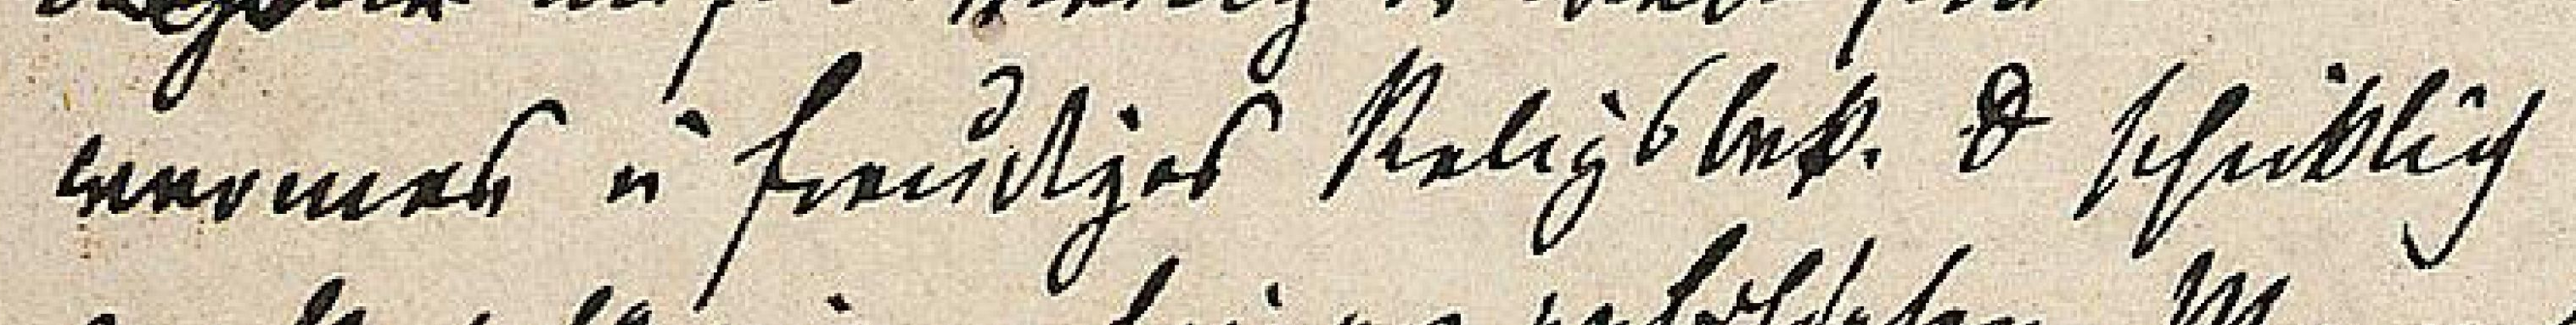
warmes u freudiges Religsbek. o schicklich
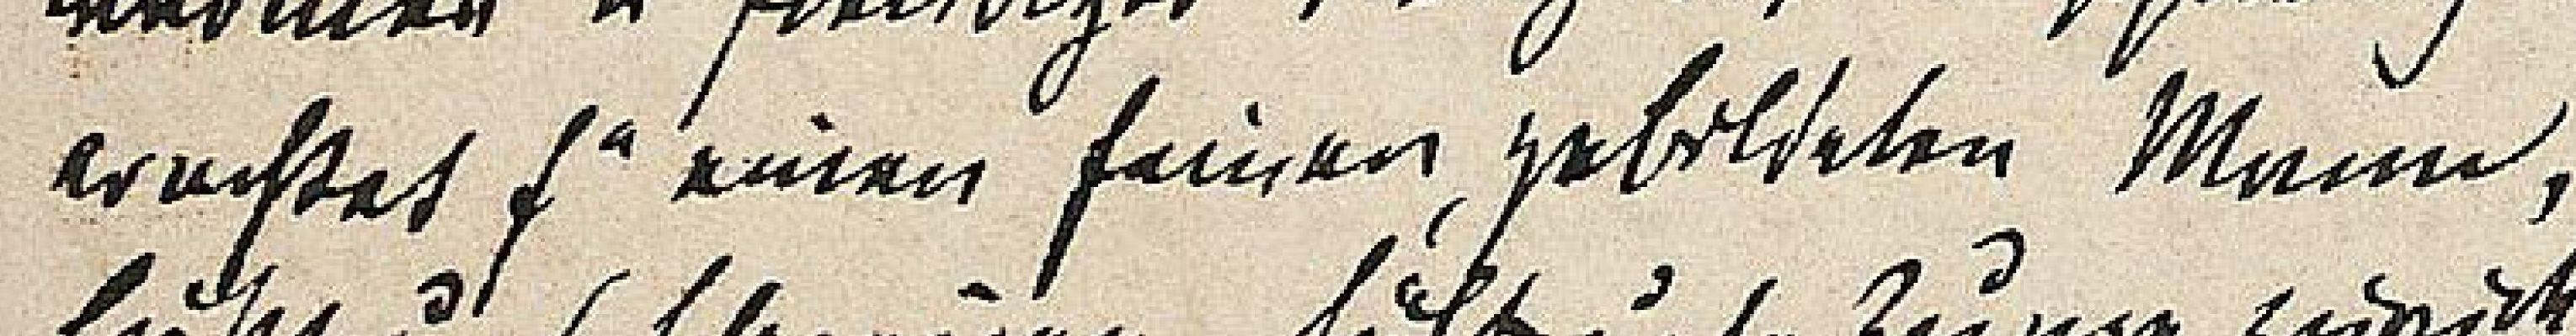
erachtet fü einen feinen gebildeten Mann.
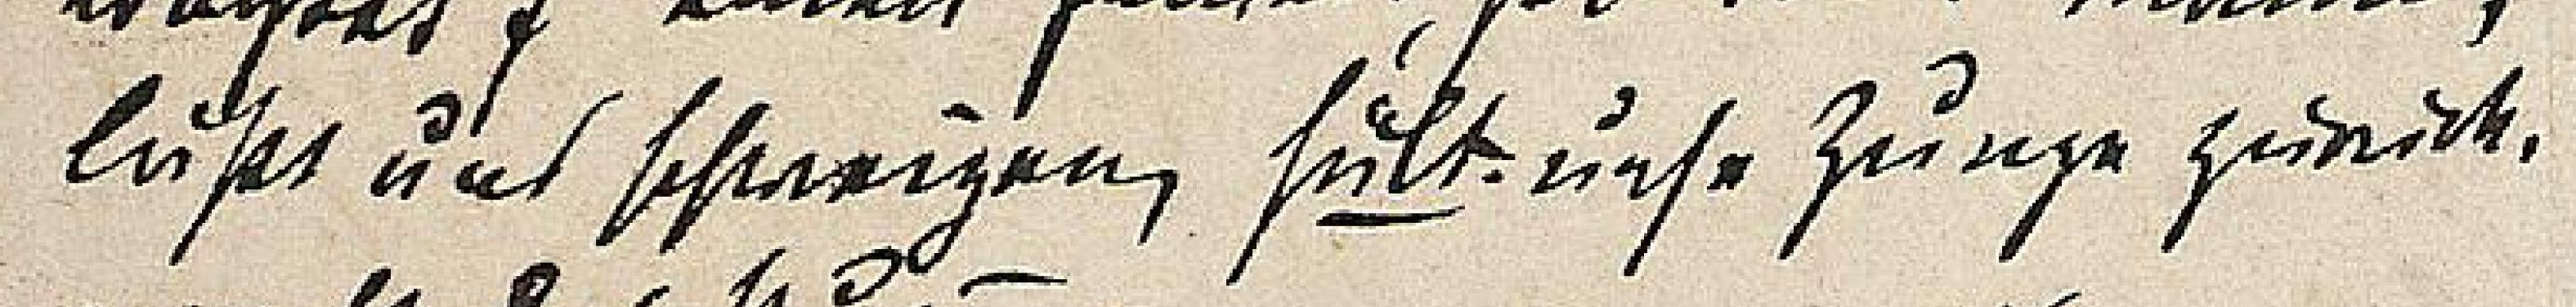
läßt uns schweigen, hält unsr. Zunge zurück,
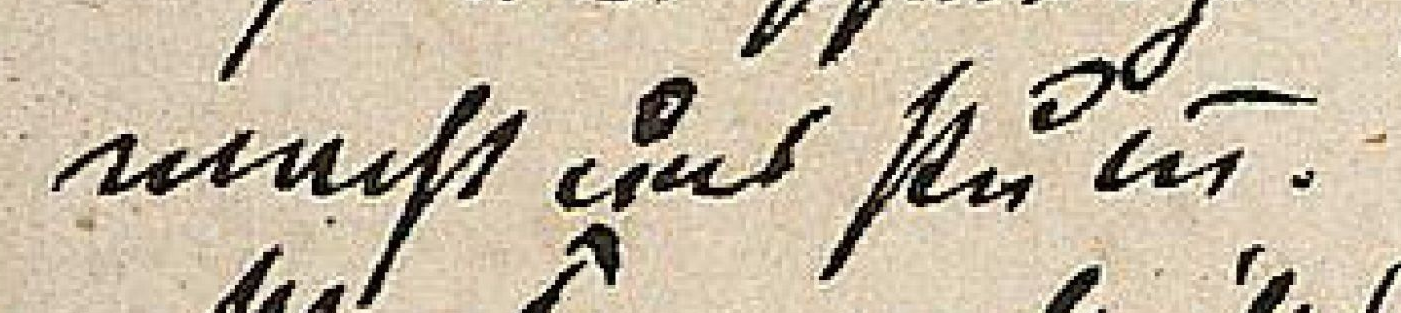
macht uns stum.
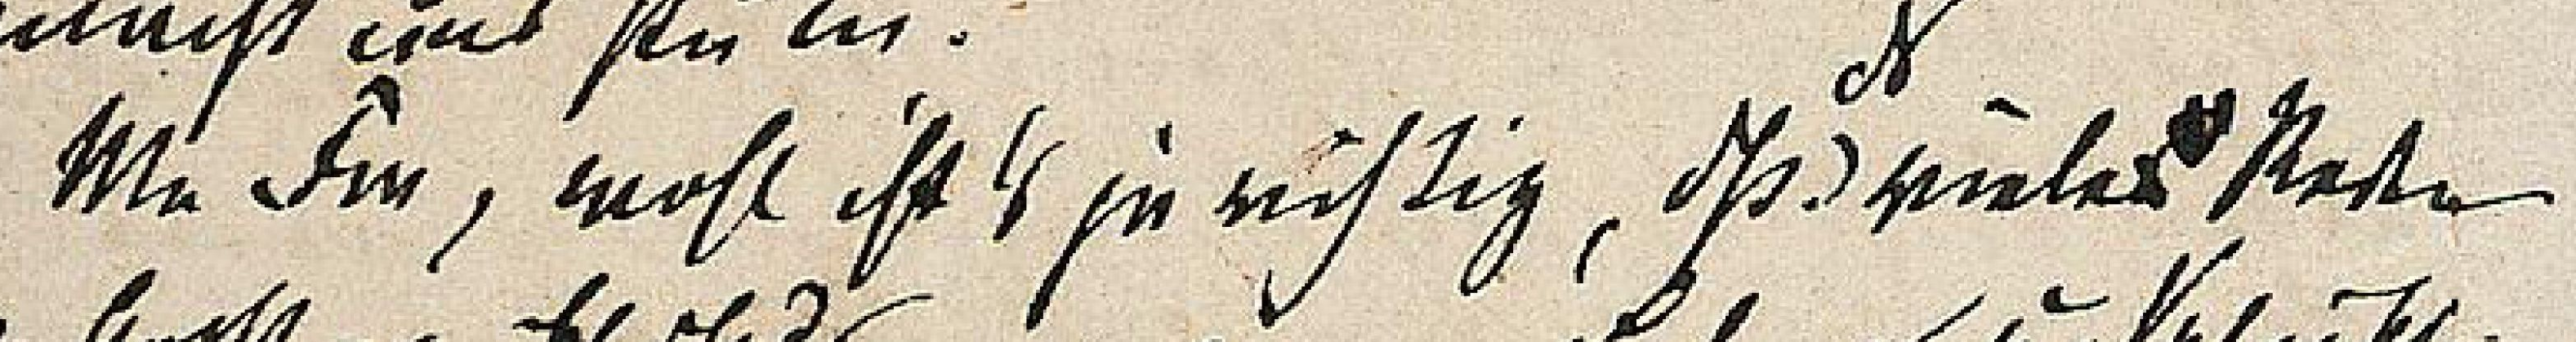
M Frn, wohl ist's ja richtig, daß vieles Reden
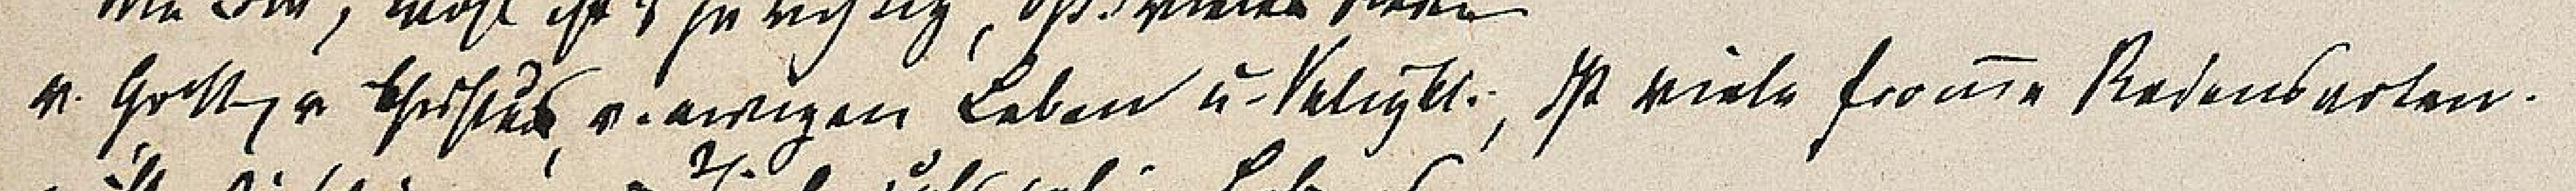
v Gott, v. Christus v. ewigen Leben u. Seligkt., daß viele frome Redensarten.
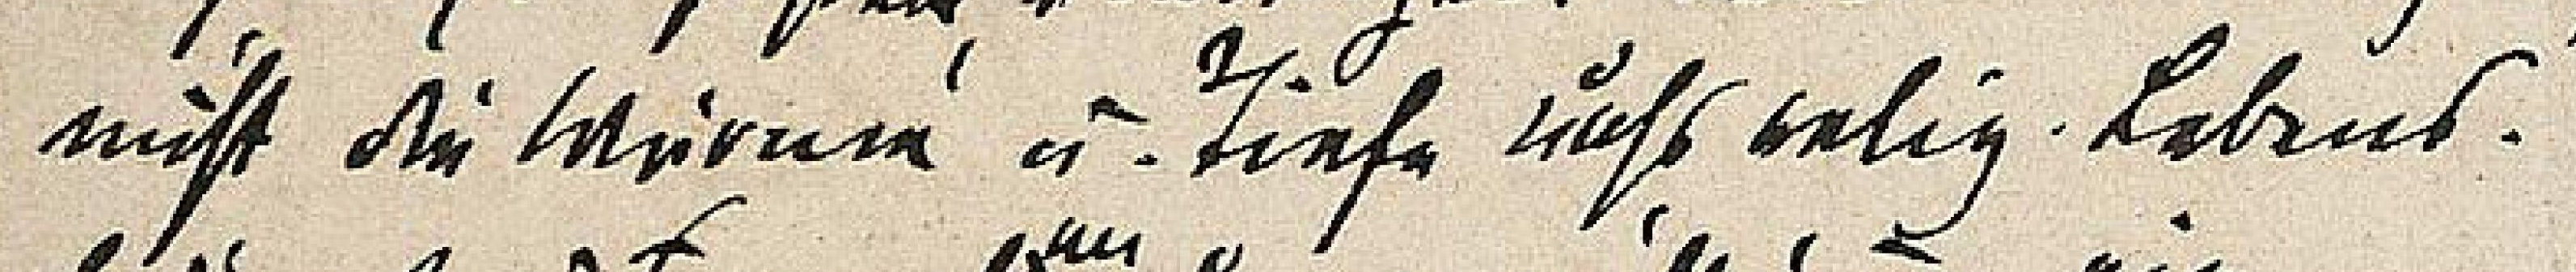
nicht die Wärme u. Tiefe unss relig. Lebens.
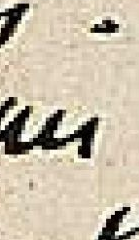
en
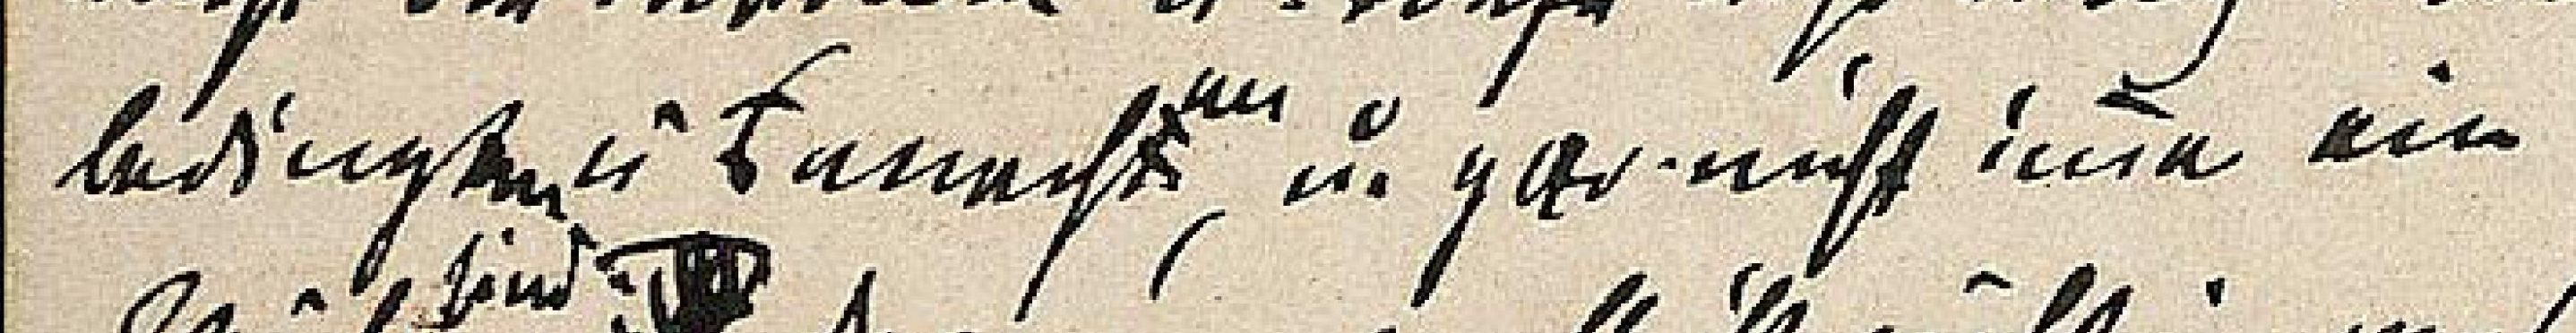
bedingen u. smacht, u gar nicht ime ein
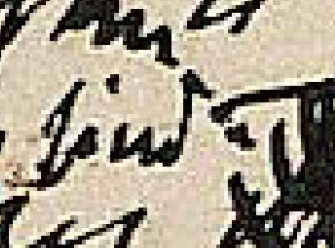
sind
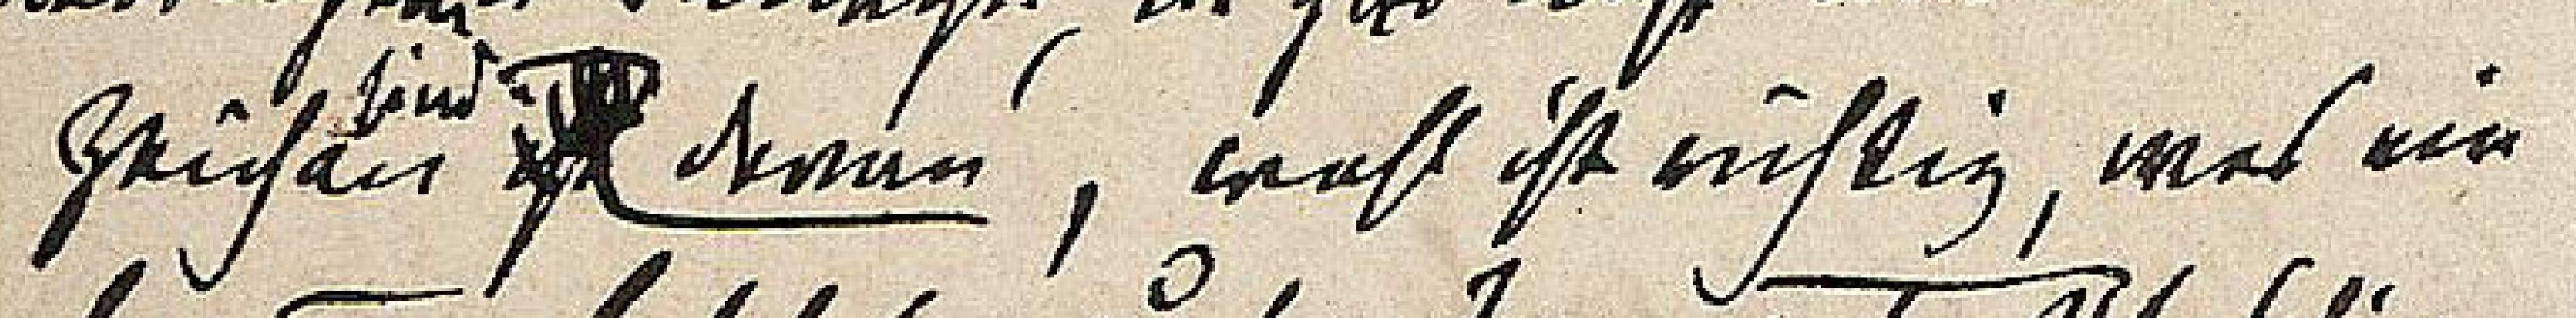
Zeichen ist davon, wohl ist richtig, was ein
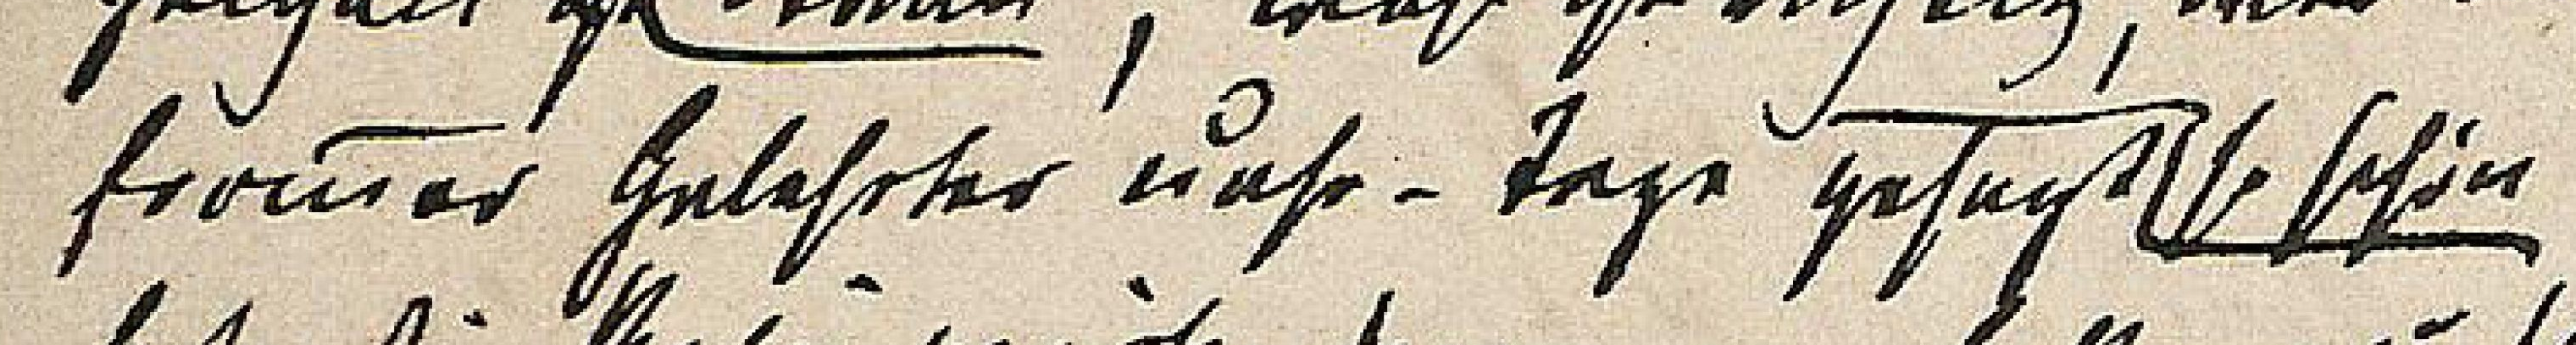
fromer Gelehrter unsr. Tage gesagt so schön
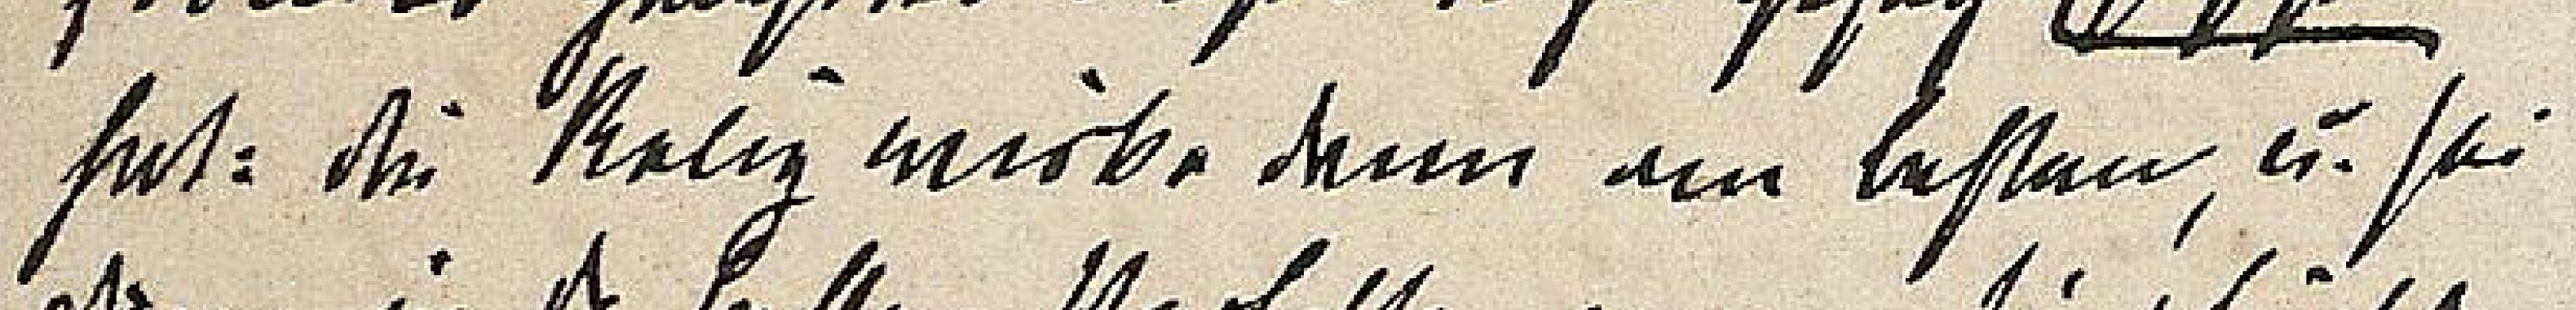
hat: die Relig wirke dann am besten u. sei
